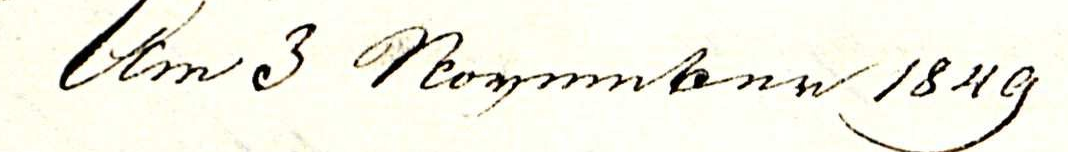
Am 3 November 1849
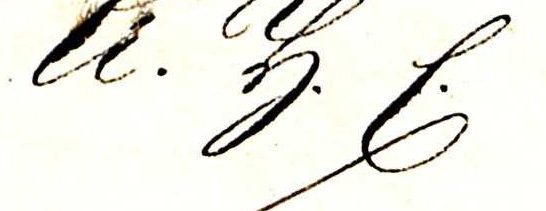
A. H. E.
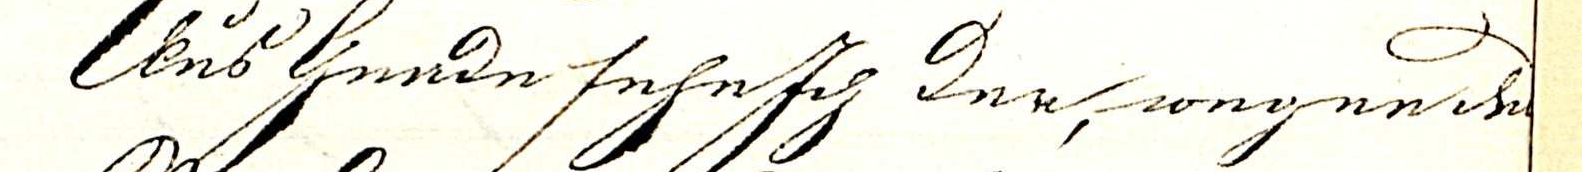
Aus Gnade sehe Jch der, wegen des
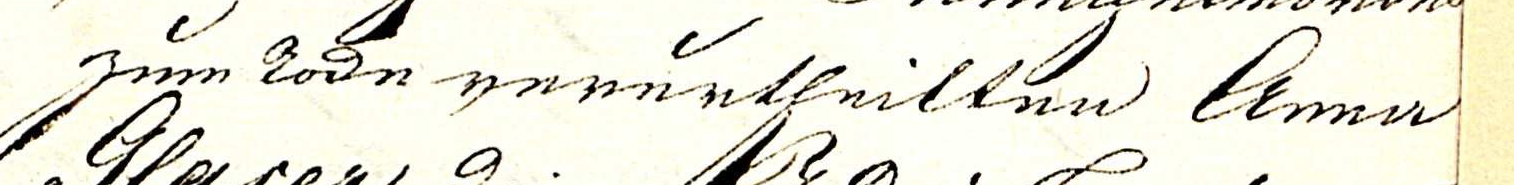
zum Tode verurtheilten Anna
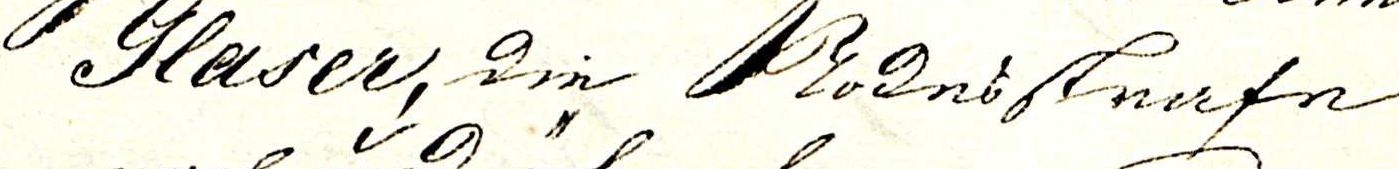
Glaser, die Todesstrafe
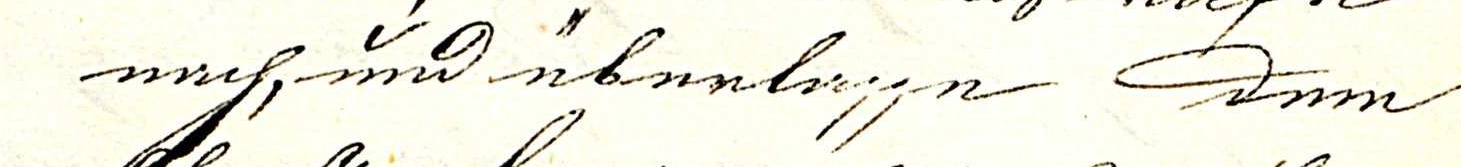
nach, und überlasse dem
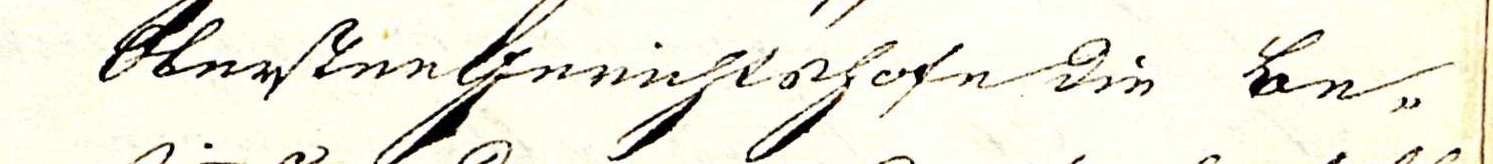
Obersten Gerichtshofe die Be¬
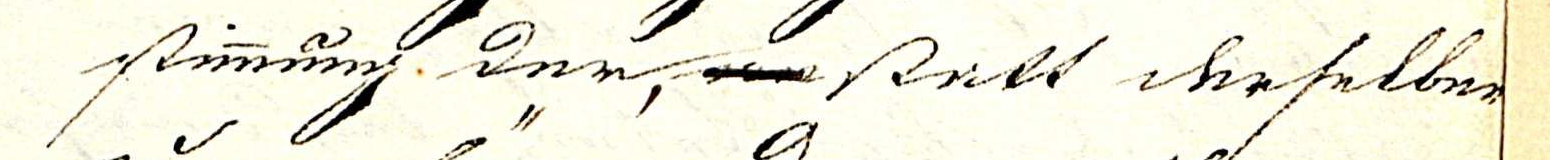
stimmung der, statt derselben
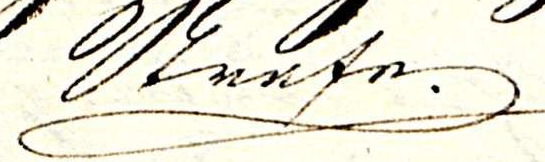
Strafe.
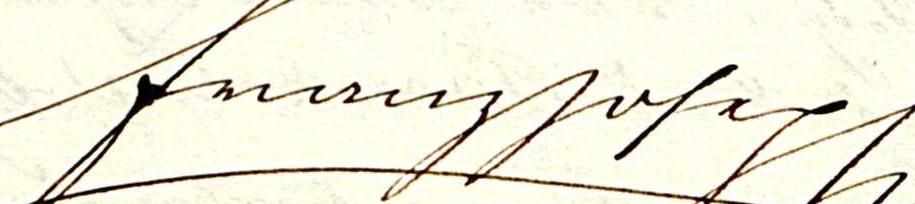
Franz Joseph
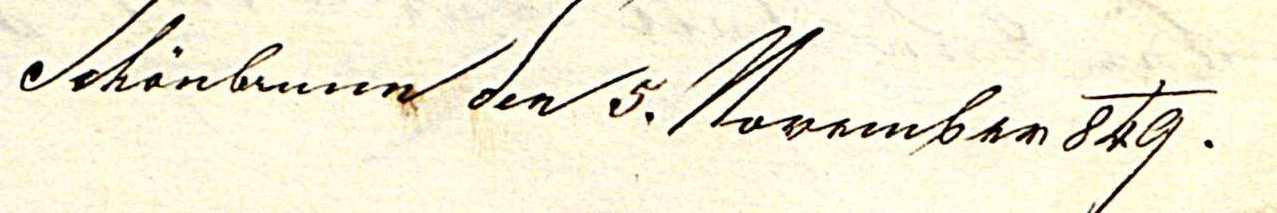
Schönbrunn den 5. November 849.
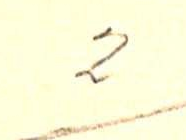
2
